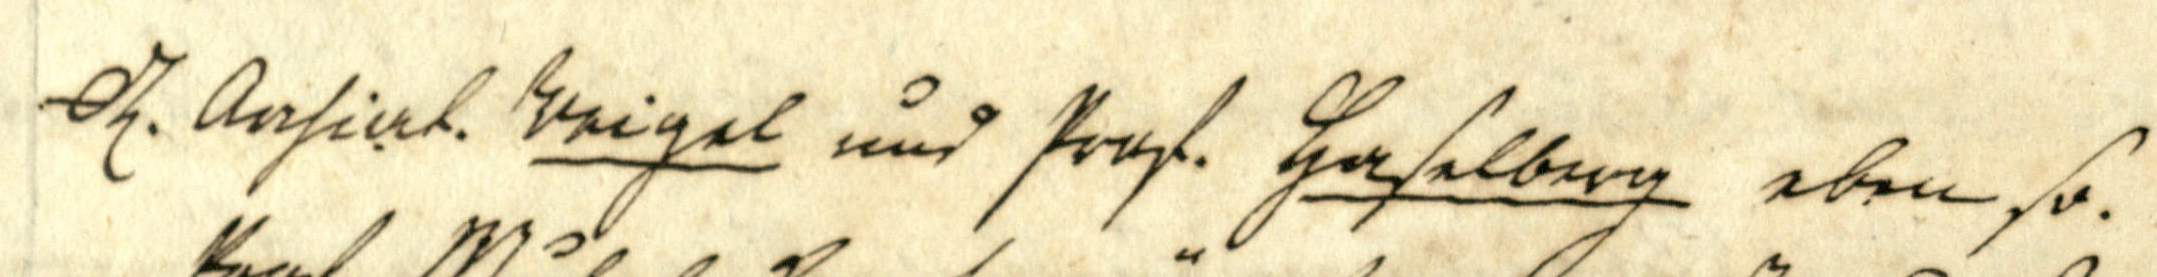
dh. Archiat. Weigel und Prof. Haselberg eben so.
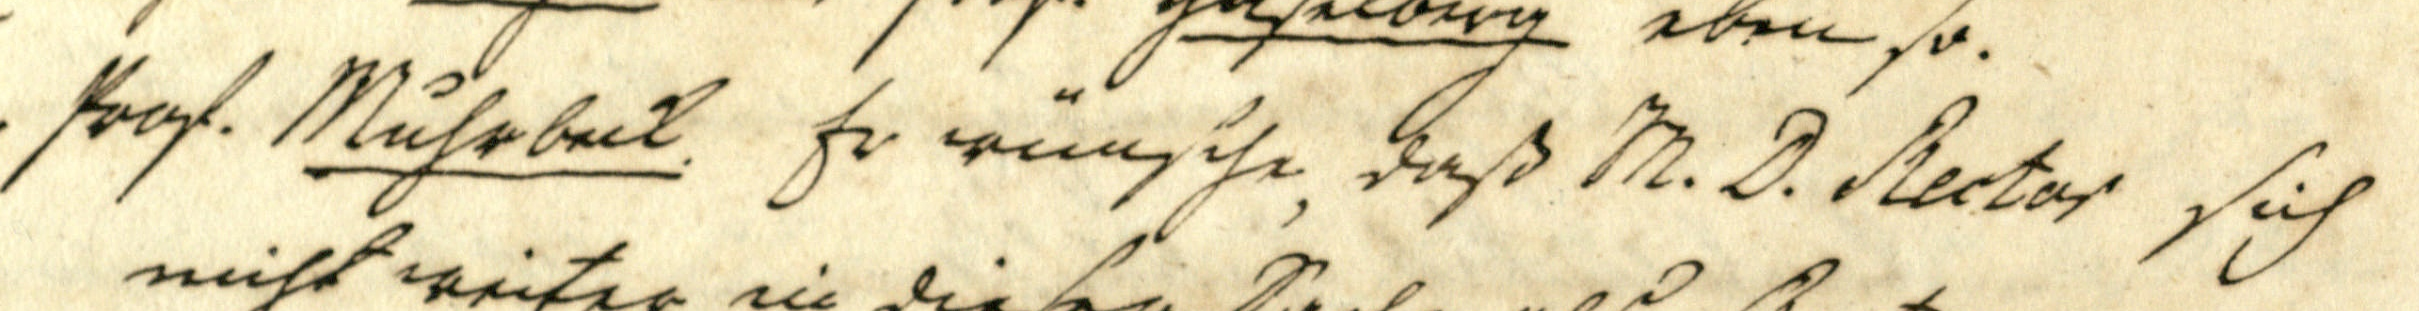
Prof. Muhrbeck. Er wünsche, daß M. D. Rector sich
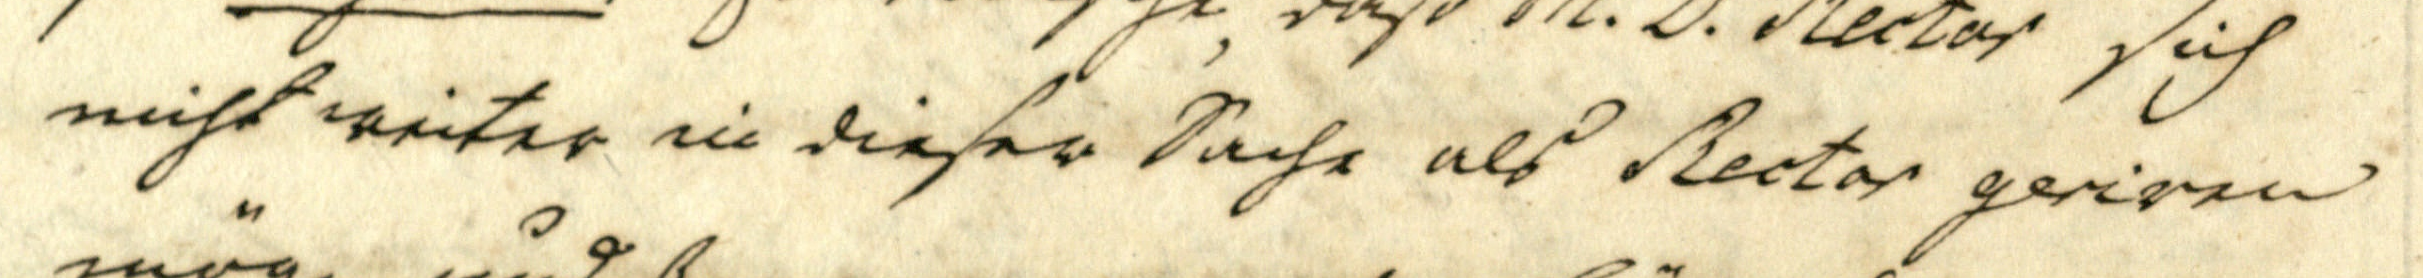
nicht weiter in dieser Sache als Rector geriren
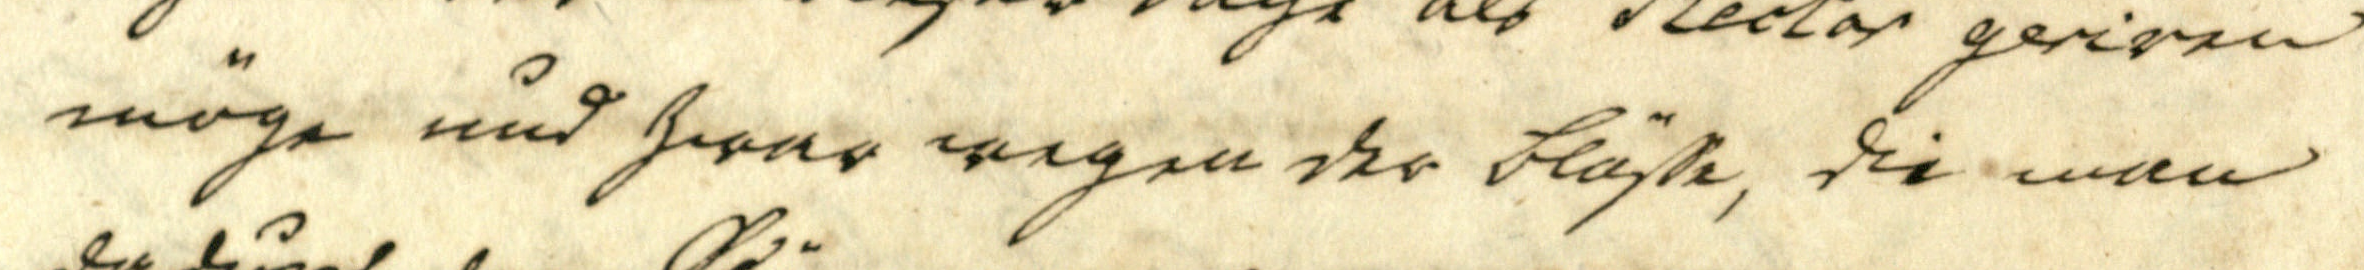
möge und zwar wegen der Blösse, die man
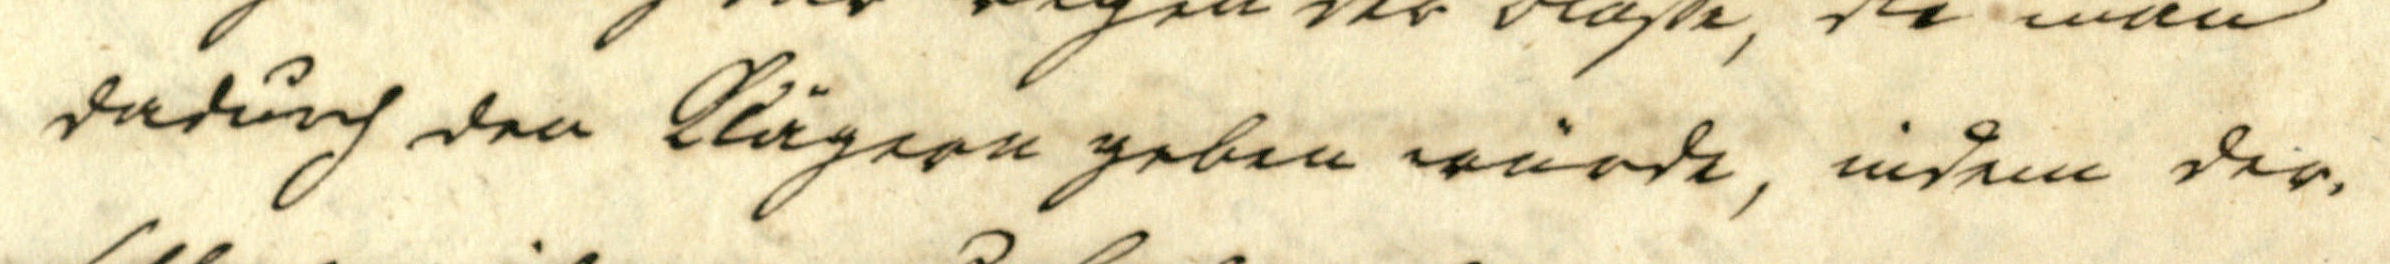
dadurch den Klägern geben würde, indem der¬
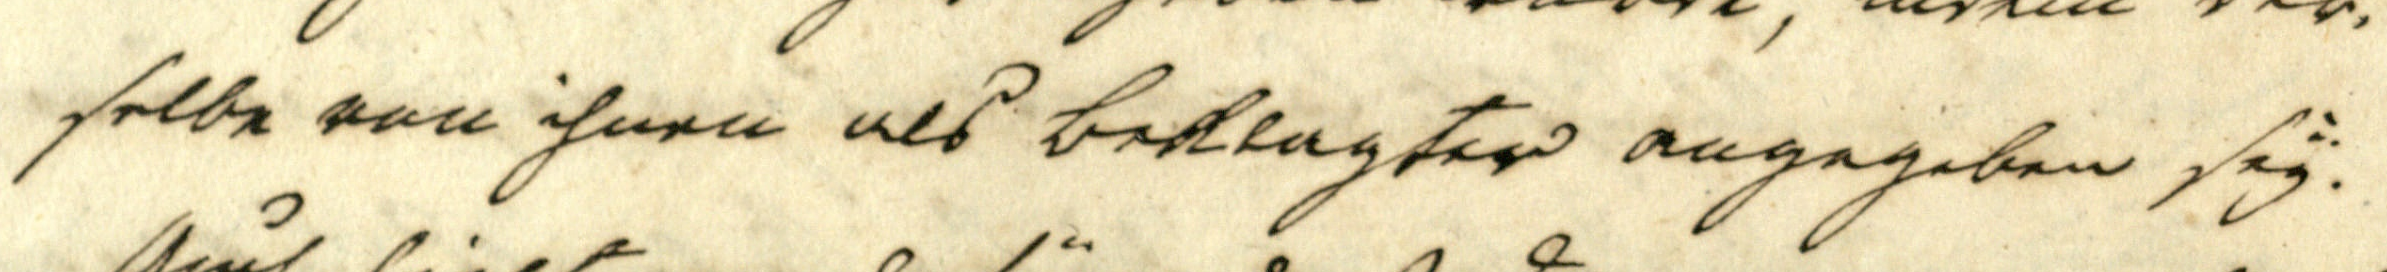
selbe von ihnen als Beklagter angegeben seÿ.
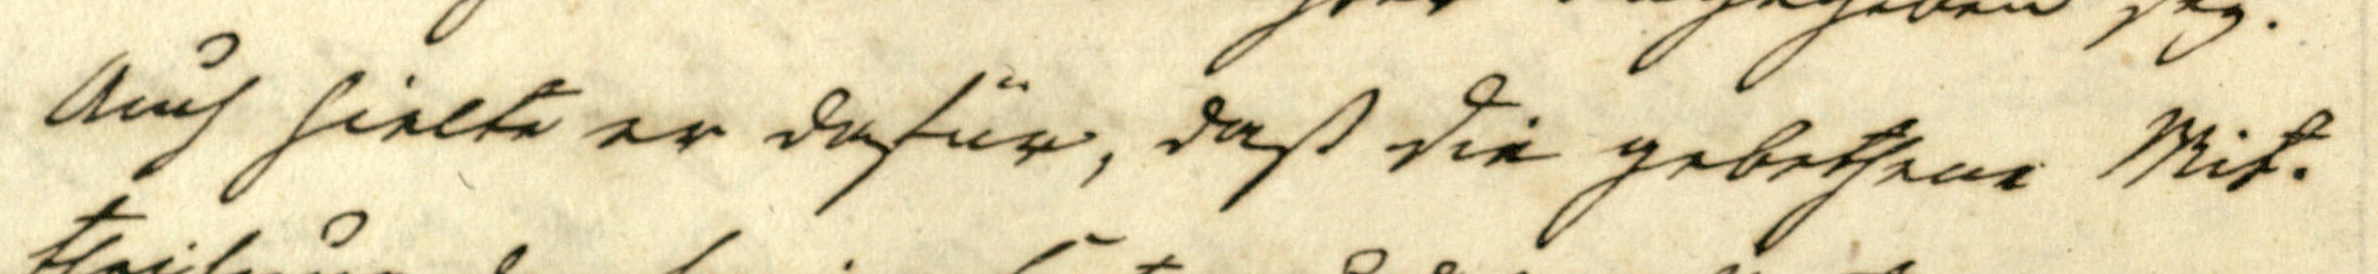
Auch hielte er dafür, daß die gebethene Mit¬
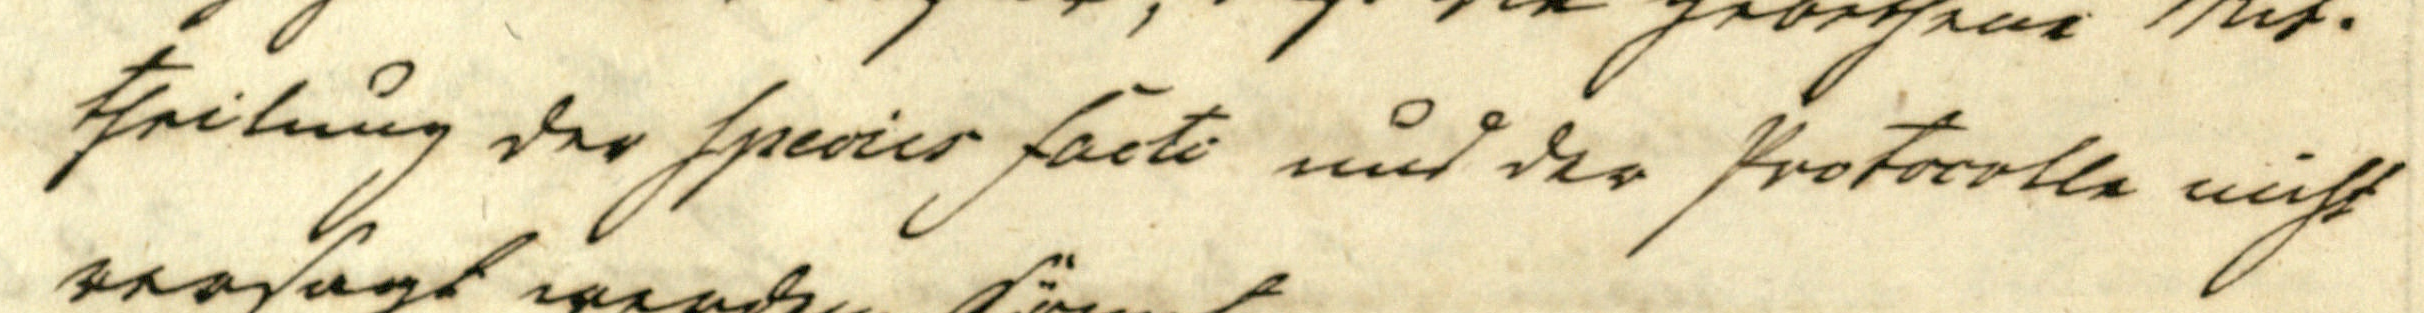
theilung der species facti und der Protocolle nicht
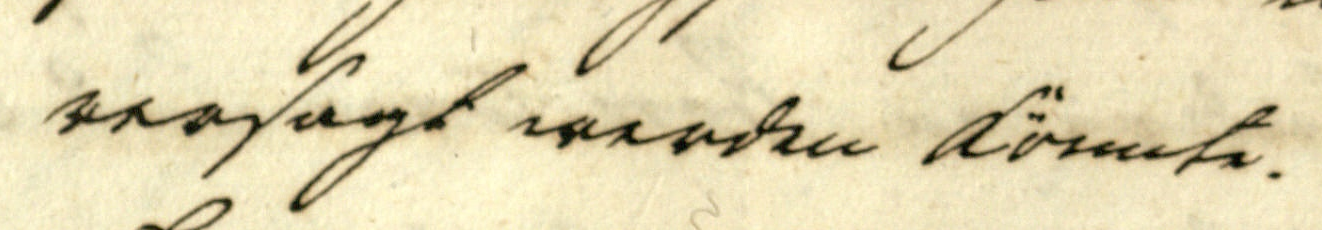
versagt werden könnte.
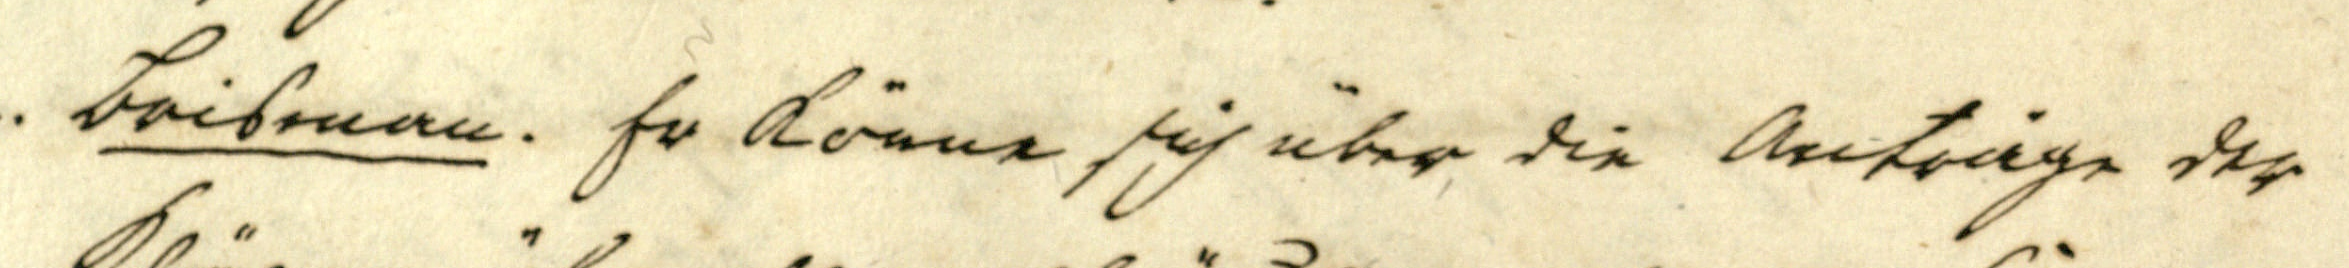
Brisman. Er könne sich über die Anträge der
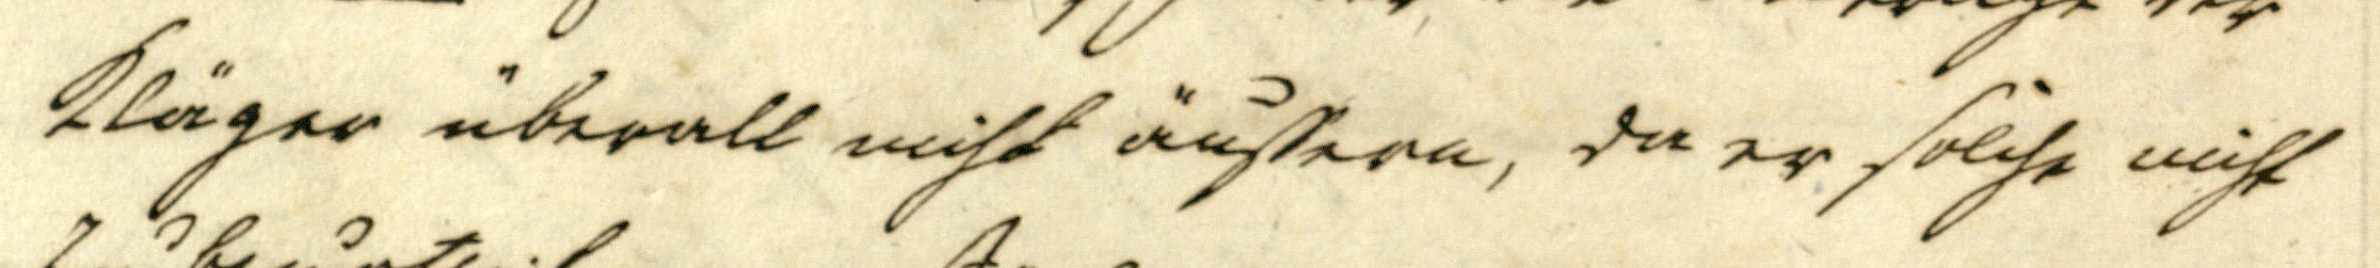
Kläger überall nicht äussern, da er solche nicht
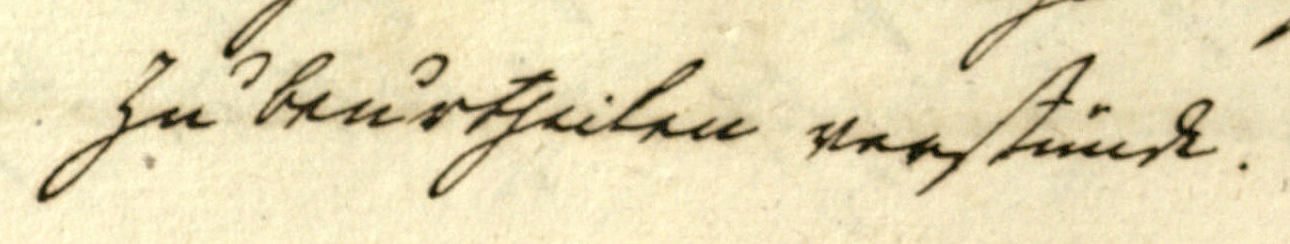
zu beurtheilen verstünde.
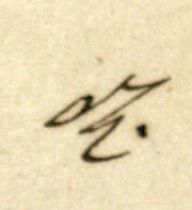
dh.
